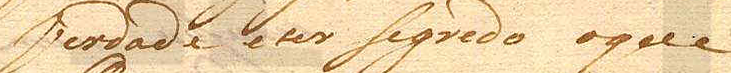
Verdade e ter segredo o que
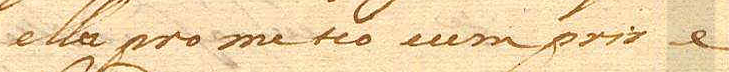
ella prometeo cumprir e
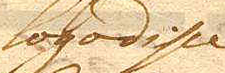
logo disse
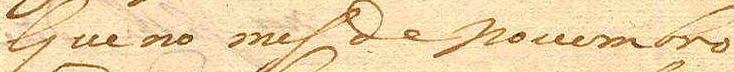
E que no mes de Nouembro
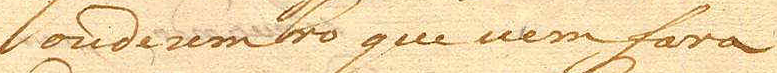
ou dezembro que uem fara
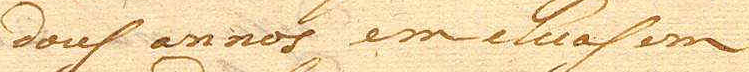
dous annos em eluas em
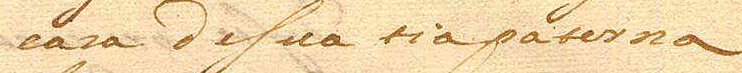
caza de sua tia paterna
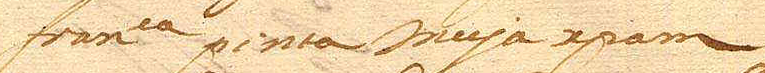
franca pinta meya xpam
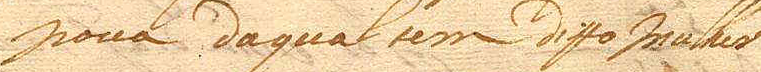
noua da qual tem ditto mulher
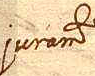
juramto
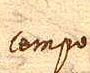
tempo
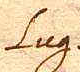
Lug.
